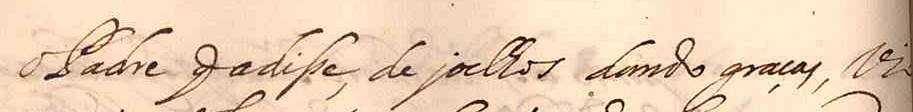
o Padre q̄ a disse, de joelhos dando graças, vi
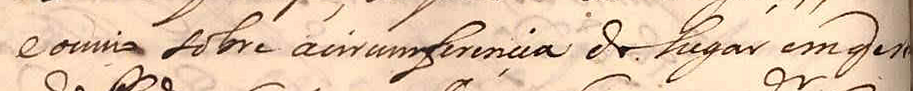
e ouuio sobre a circunferencia do lugar em q̄ es
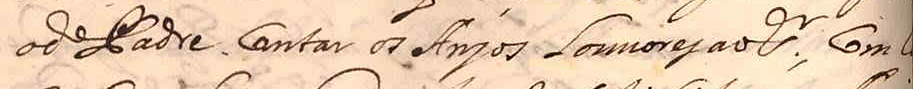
o do Padre cantar os Anjos Louuores ao S.or com c
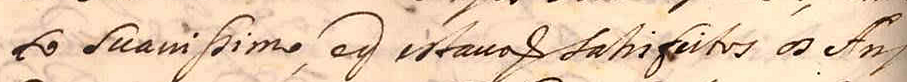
to suauissimo, e q̄ estauaõ satisfeitos os Anj
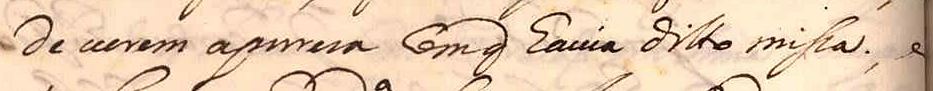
de uerem a pureza em q̄ hauia ditto missa; e
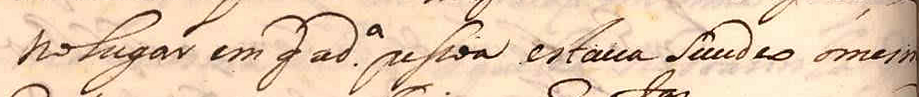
no lugar em q̄ a d.a pessoa estaua sucedeo o mesm
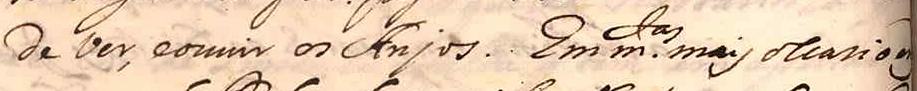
de ver, e ouuir os Anjos. Em m.tas mais occazioen
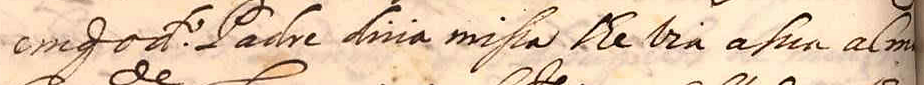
em q̄ o d̄.o Padre disia missa lhe via a sua alm
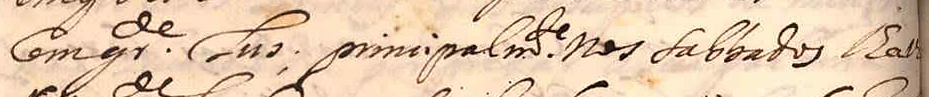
Com gr.de Lus; principalm.te nos sabbados lha v
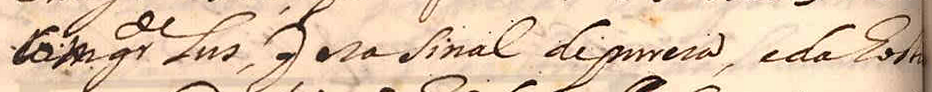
com grde lus, q̄ era sinal de pureza, e da host
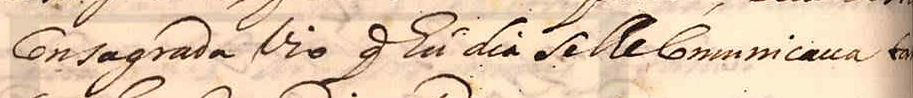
Consagrada Vio q̄ hū dia se lhe Comunicaua ta
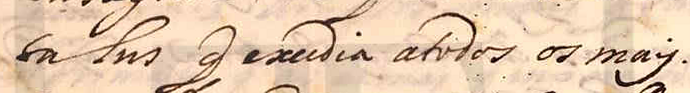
ta lus q̄ excedia a todos os mais.
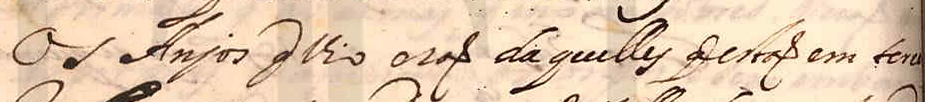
Os Anjos q̄ vio eraõ daquelles q̄ estaõ em terc
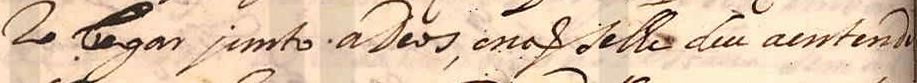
Ro lugar junto a Deos, e naõ se lhe deu a entende
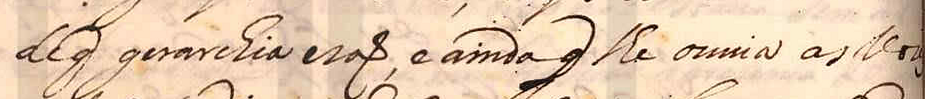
de q̄ gerarchia eraõ, e ainda q̄ lhe ouuia as voze
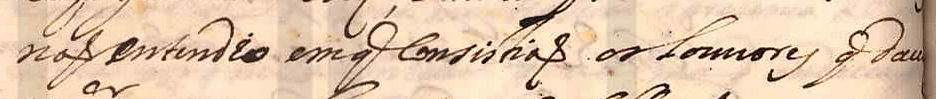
naõ entendeo em q̄ consistiaõ os louuores q̄ dau
